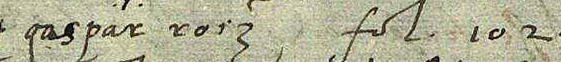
gaspar roiz̄ fol. 102.
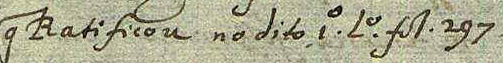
q̄ Ratificou no dito .1o. Lo. fol. 297 -
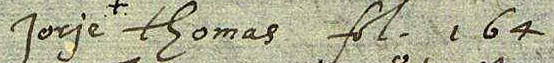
Jorge thomas fol. 164
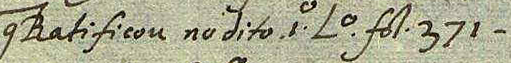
q̄ Ratificou no dito .1o. Lo. fol. 371 -
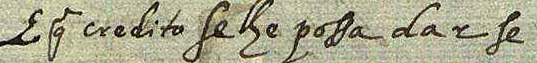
E q̄ credito se lhe possa dar se
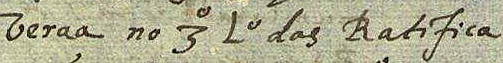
veraa no 3o Lo das Ratifica
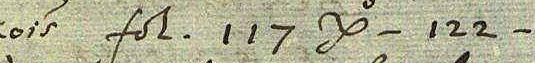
çois̄ fol. 117 ꝟo – 122 –
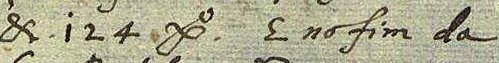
&. i24 ꝟo. E no fim da
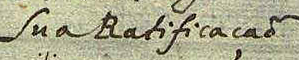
sua Ratificaçaõ
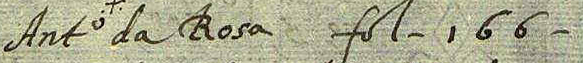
Anto da Rosa fol- 166 -
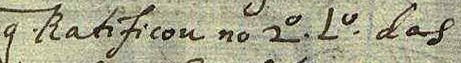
q̄ .Ratificou no 2o Lo. das
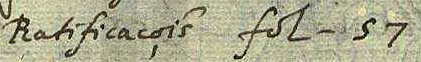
Ratificaçois̄ fol – 57
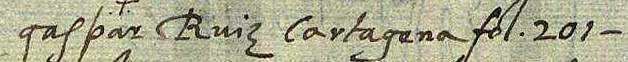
gaspar Ruiz Cartagena fol. 201 -
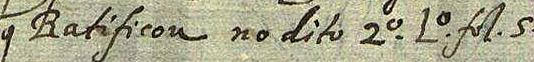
q̄ Ratificou no dito 2o. Lo. fol 5
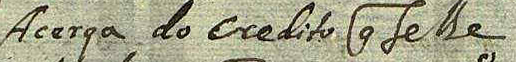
Acerqa do Credito q̄ se lhe
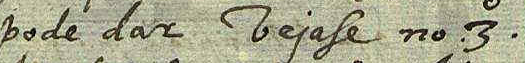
pode dar vejase no .3o.
